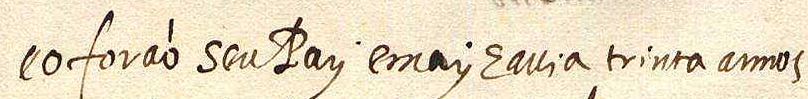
e o foraõ seu Pay e may E auia trinta annos
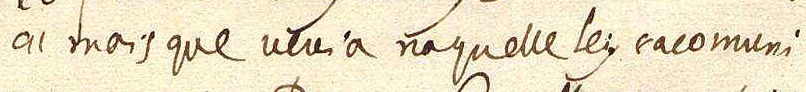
as mais que ueuia naquelle ley e a comuni
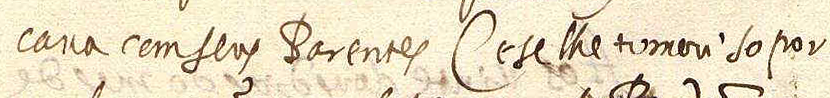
caua com seus Parentes (e se lhe tomou so por
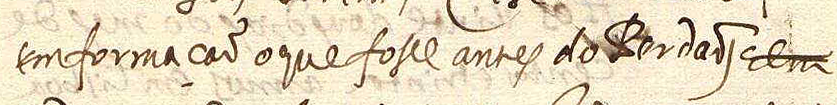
emformaçaõ o que fosse antes do Perdaõ) E em
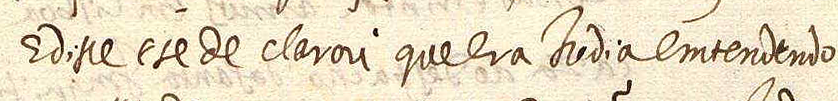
E disse e se declarou que era Iudia emtendendo
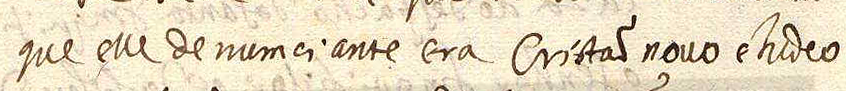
que elle denumciante era Cristaõ nouo e Iudeo
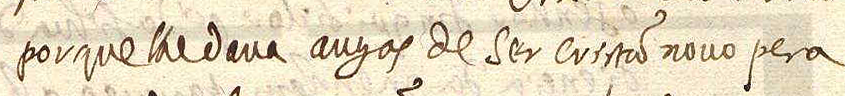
porque lhe daua augas de ser cristaõ nouo pera
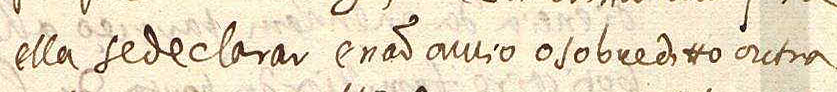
ella se declarar e naõ ouuio o sobreditto outra
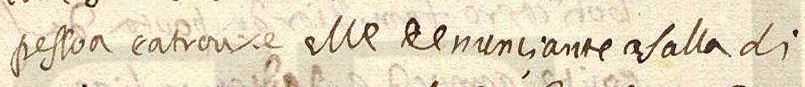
pessoa e a trouxe elle denunciante a salla di
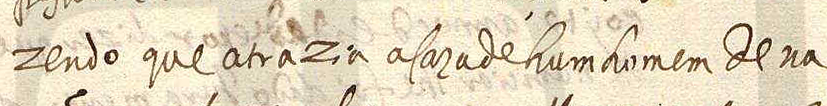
zendo que a trazia a Caza de hum homem de na
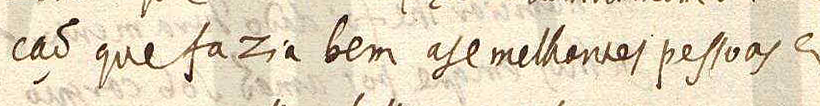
çaõ que fazia bem a semelhantes pessoas e
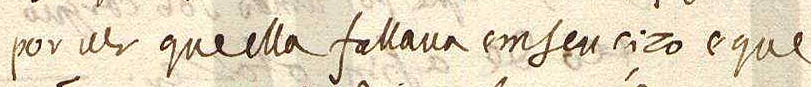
por uer que ella fallaua em seu cizo e que
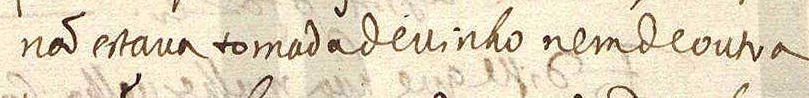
naõ estaua tomada de uinho nem de outra
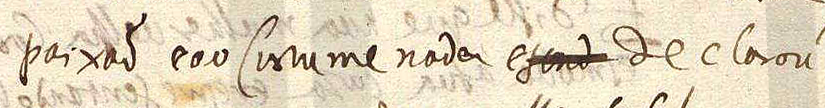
paixaõ e ao Custume nada e send declarou
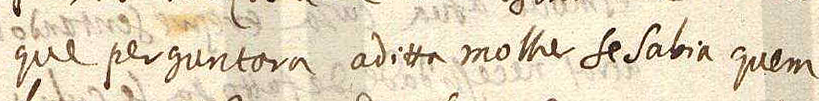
que perguntara a ditta molher se sabia quem
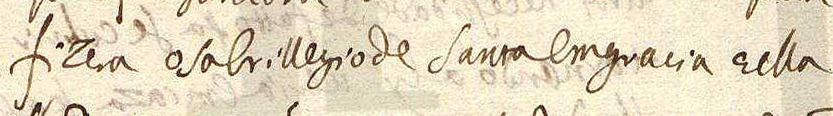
fizera o sacrillegio de Santa emgracia E ella
